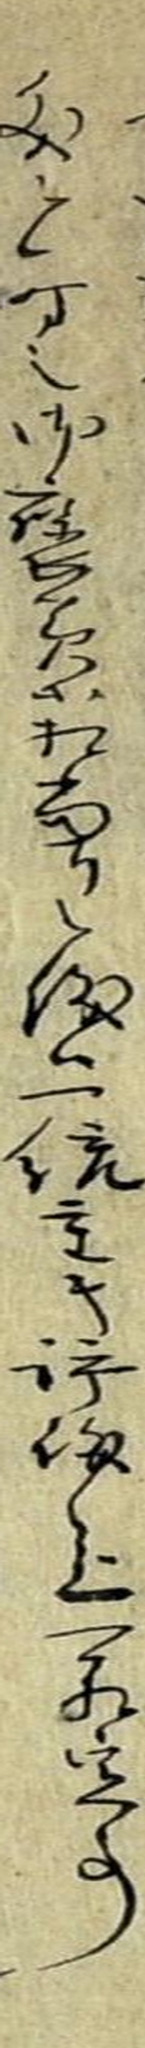義ニ候時之御褒美等相当り之儀ハ一統重キ評議之上可相定事
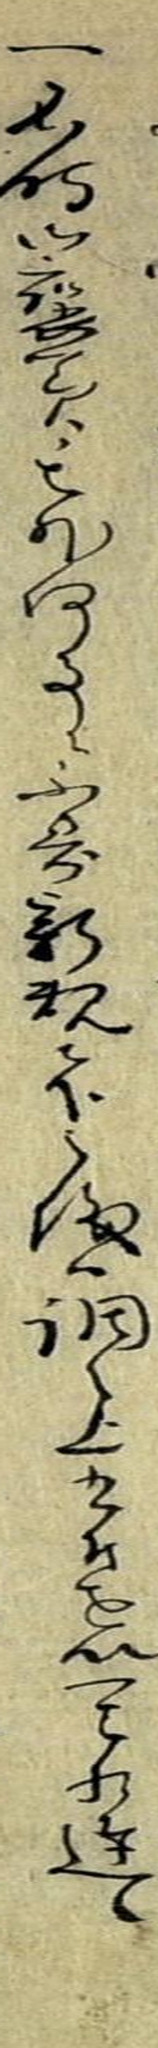一不時御褒美ハ其外何事ニ不寄新規被下之儀ハ調之上書付を以可被相達候
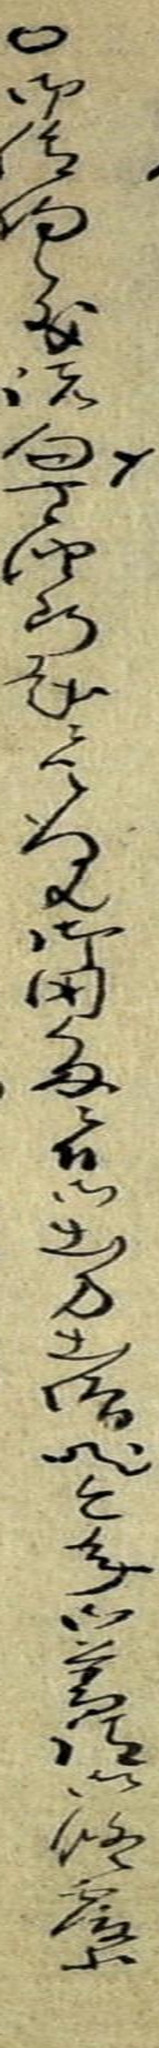〇御倹約之義諸向無油断趣ニ候得共御用多ニ付出方出増今年御普請御修覆等
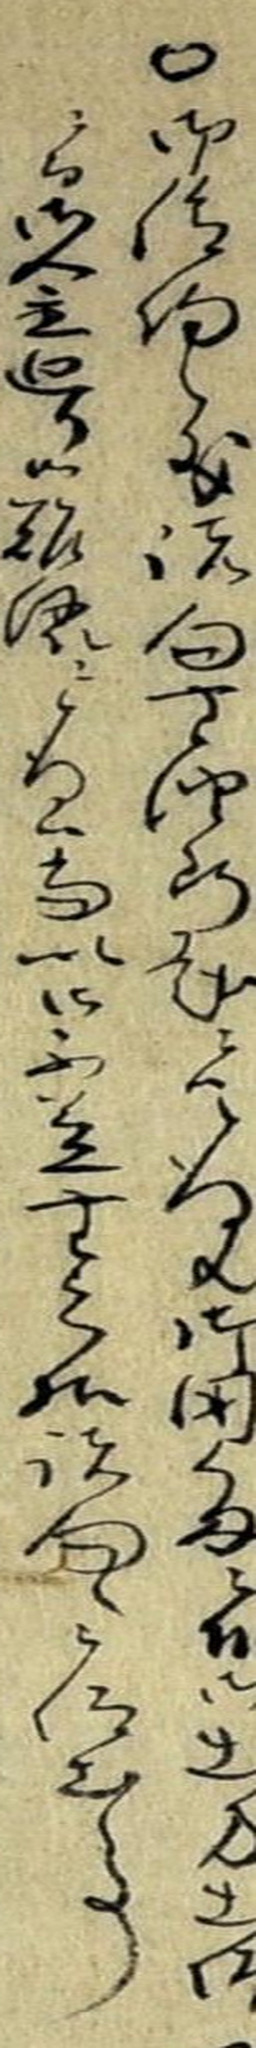ニ而御金廻り御難渋ニ候得ハ尚以御不益無之様諸向へ被仰出候事
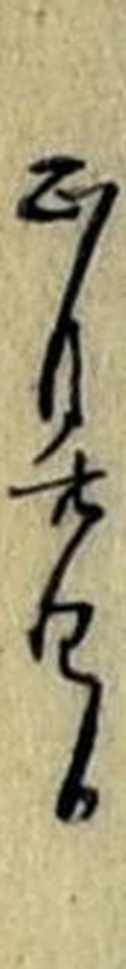正月廿四日
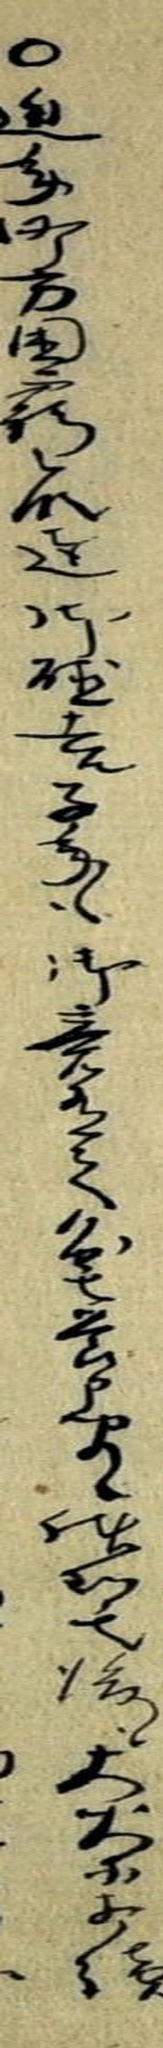〇近年町方困窮之段達御聴去ル子年も御意有之則其節申聞候其後も大火等相続
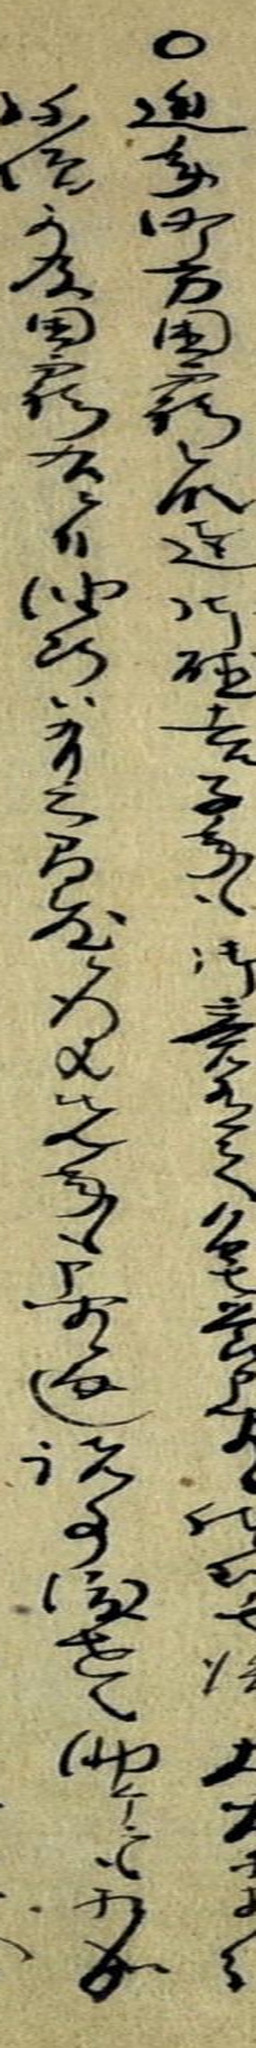弥増可及困窮右ニ付油断ハ有之間敷候得共先年も申聞候通諸事渡世之助ケニも相成
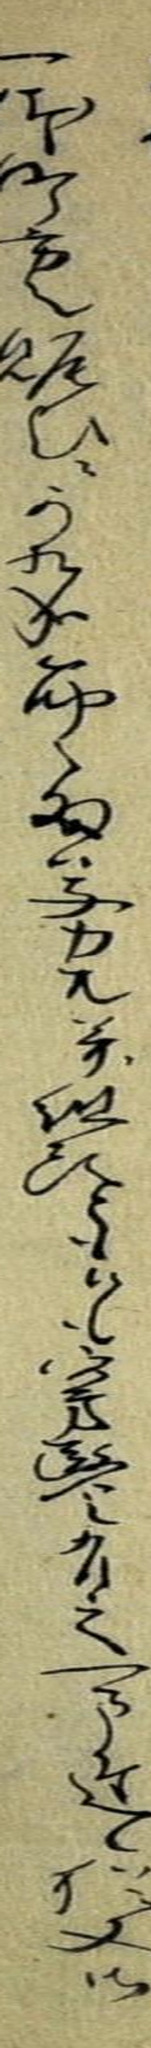一体町方之賑ひニ可相成筋之義ハ与力共并組頭とも江も穿鑿有之可申達候猶又御
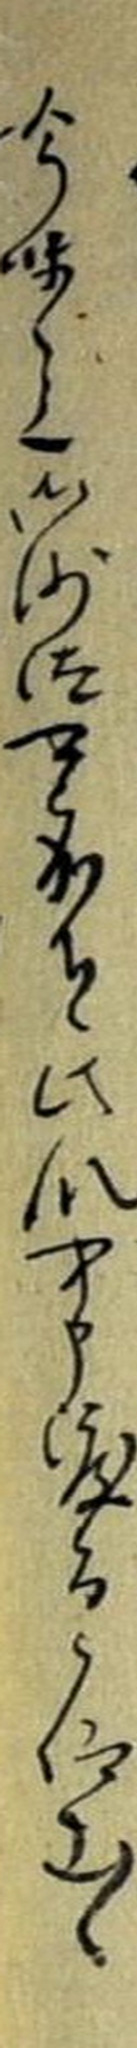吟味之上御沙汰可被成下候此段可申渡旨被仰出候
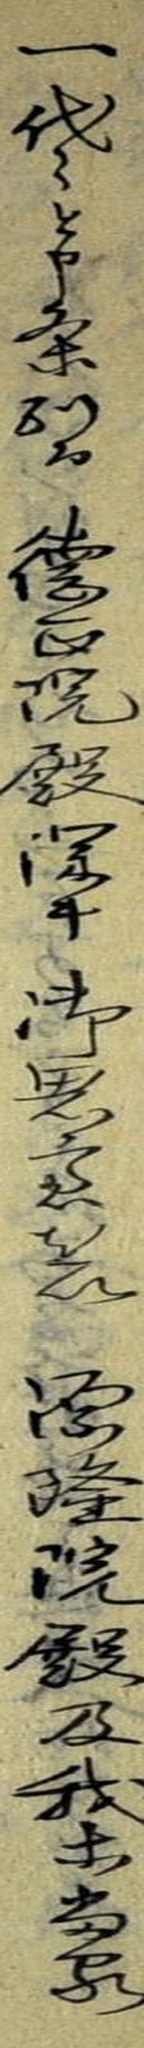一代々と申条別而徳正院殿深キ御思慮を以源隆院殿及我等当家
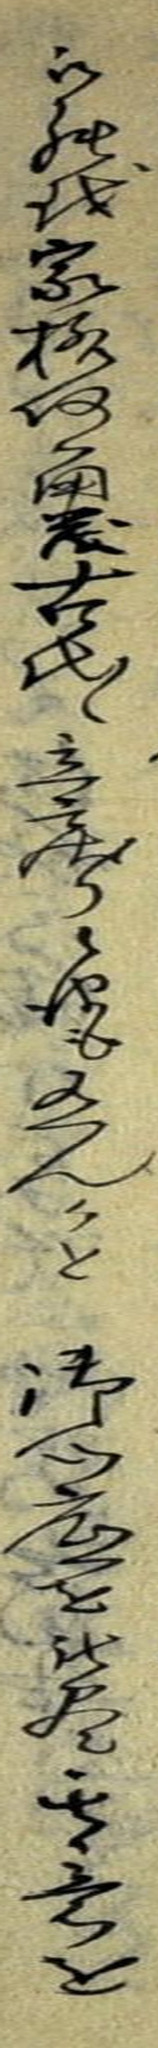江罷越家格何角茂古代へ立戻り候儀も有んと御心底を被尽其意を
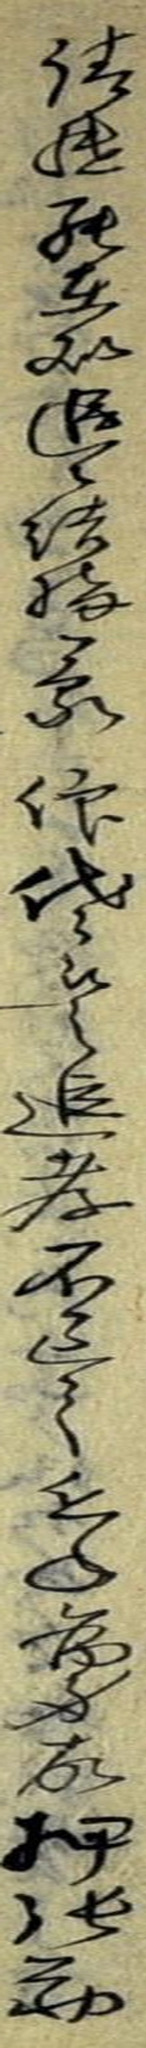請継罷在処追々結構蒙仰代々江之追孝不過之近年病身故押張勤
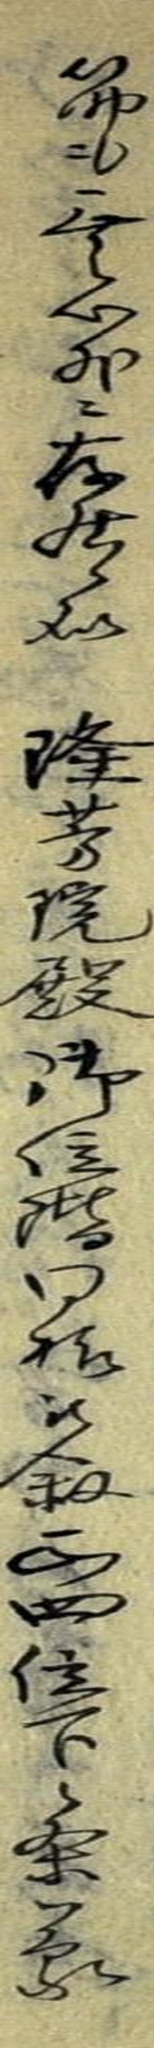筋も無之心外ニ存居候処隆芳院殿御位階同様被叙正四位下之条蒙
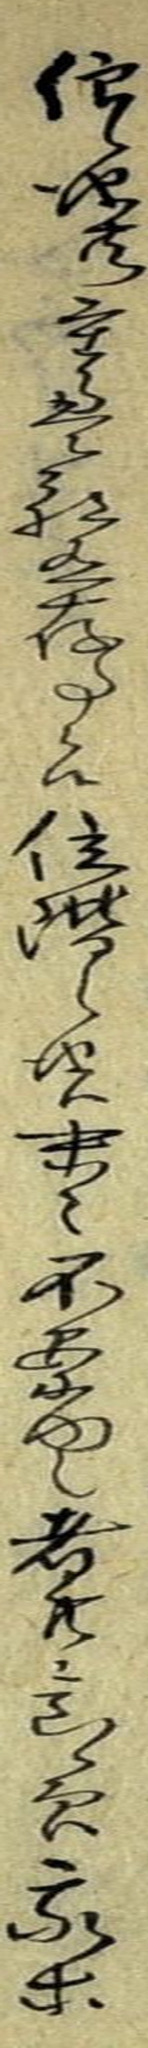仰候儀共重畳難有存事ニ候位階之儀ハ末々不案内之者共ニ至候而ハ我等
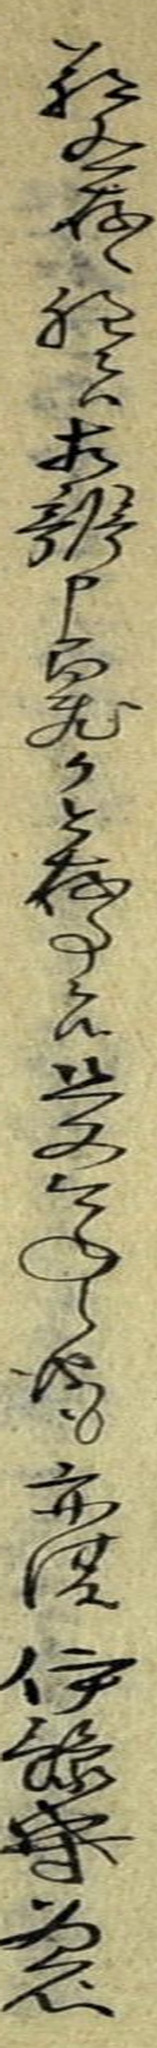難有存候程ニハ相弁申間敷クと存事ニ候且又今年之儀も亦復伊予守為名
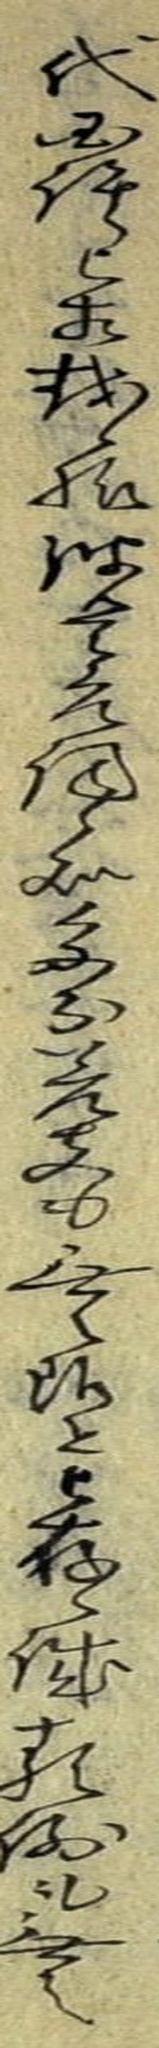代国許へ被相越候様彼是取調候処多分差支も無之趣と被存候誠類例も無之
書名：命令之部 三
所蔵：福井県文書館 Fukui Prefectural Archives
